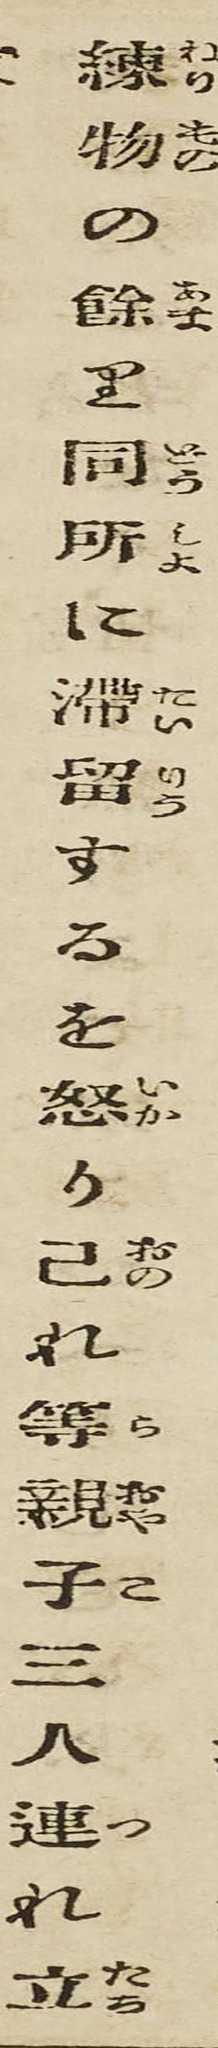練物の余り同所に滞留するを怒り己れ等親子三人連れ立
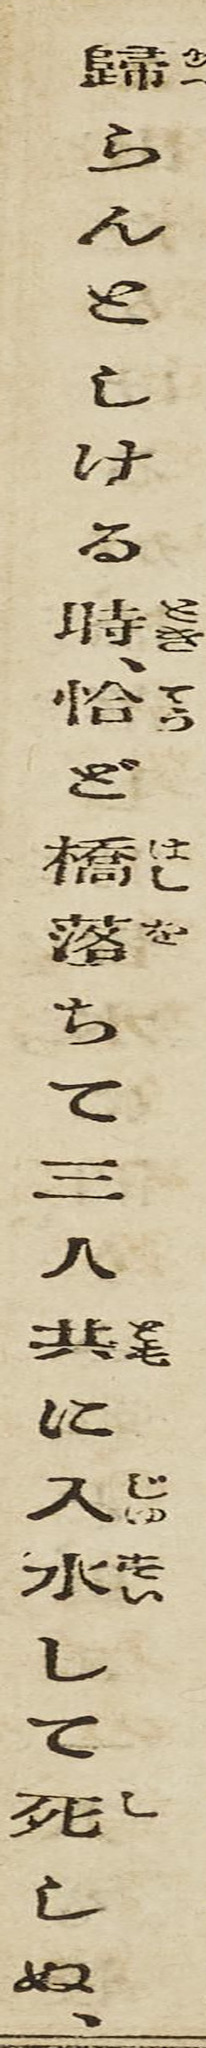帰らんとしける時、恰ど橋落ちて三人共に入水して死しぬ、
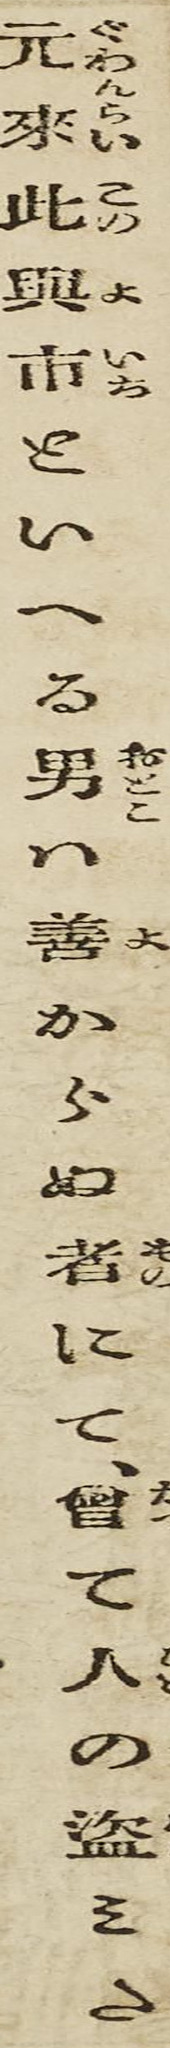元来此與一といへる男は善からぬ者にて、曽て人の盗みた
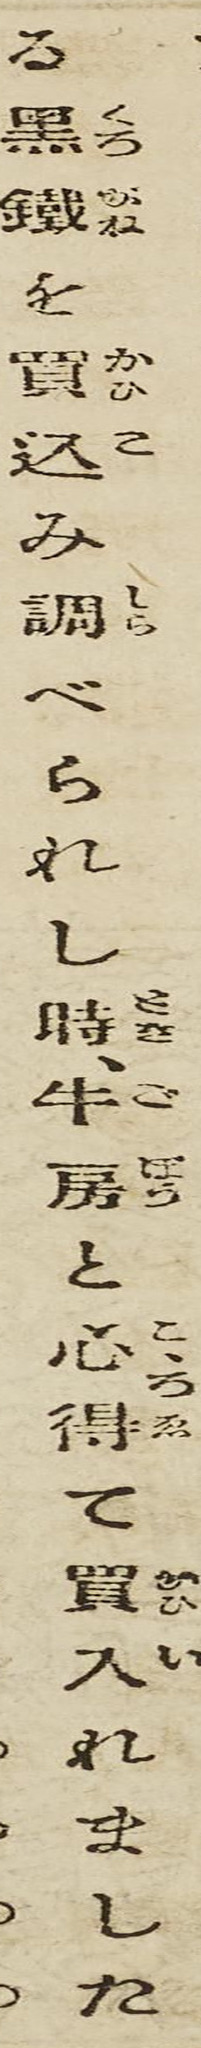る黒鉄を買込み調べられし時、牛房と心得て買入れました
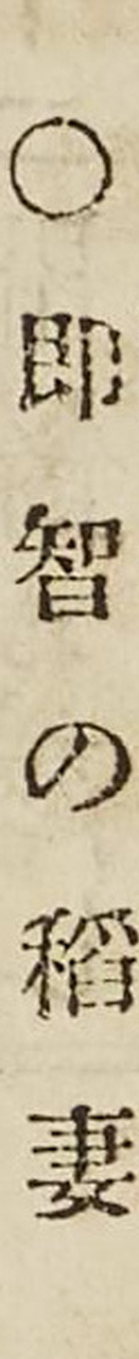○即智の稲妻
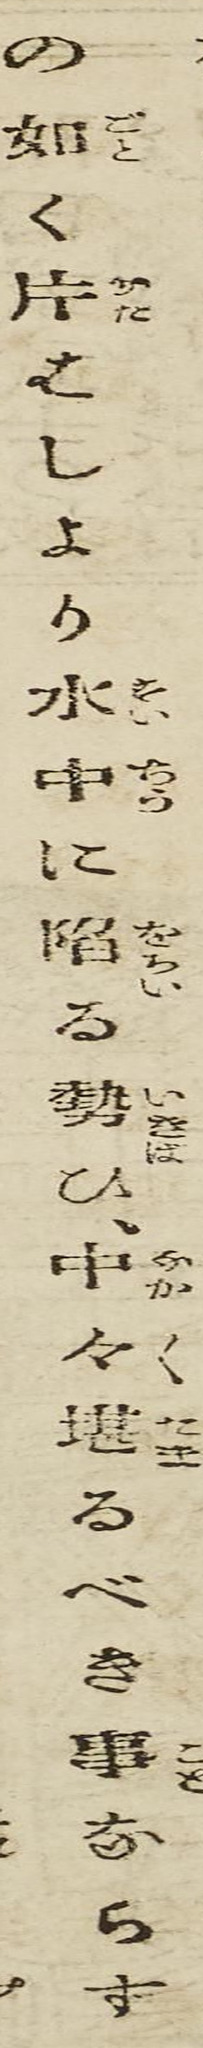の如く片はしより水中に陥る勢ひ、中々堪るべき事ならず
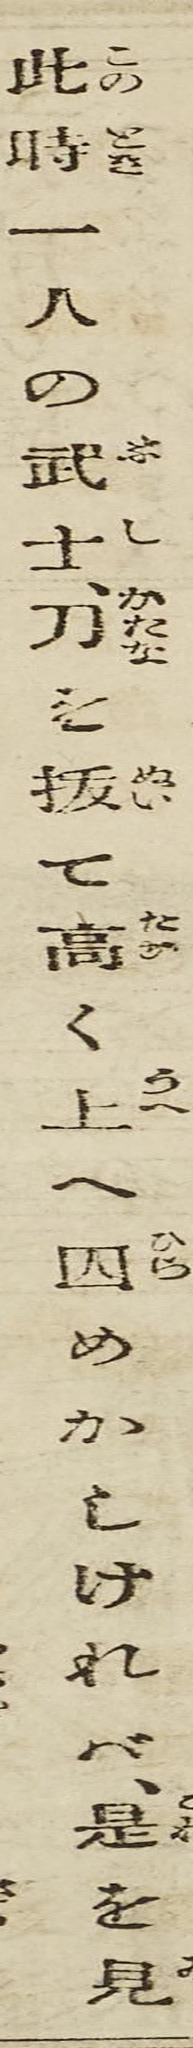此時一人の武士、刀を抜て高く上へ囚めかしければ、是を見
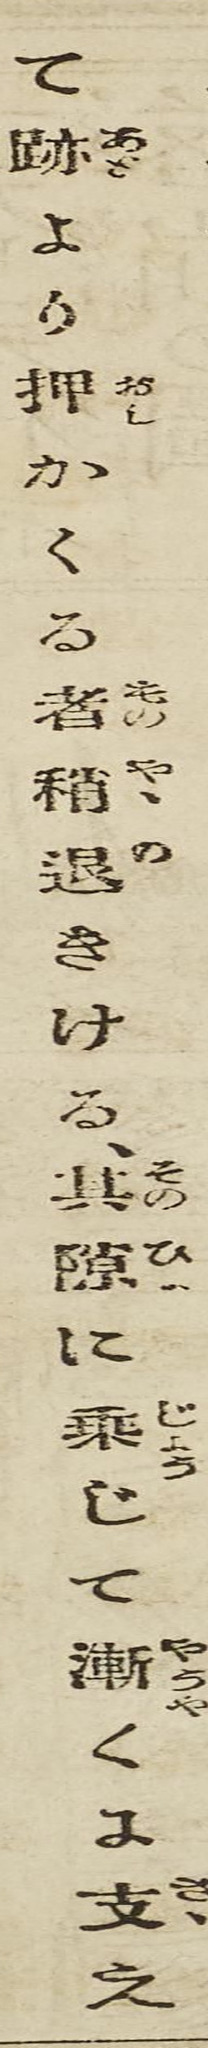て跡より押かくる者稍退きける、其隙に乗じて漸くに支え
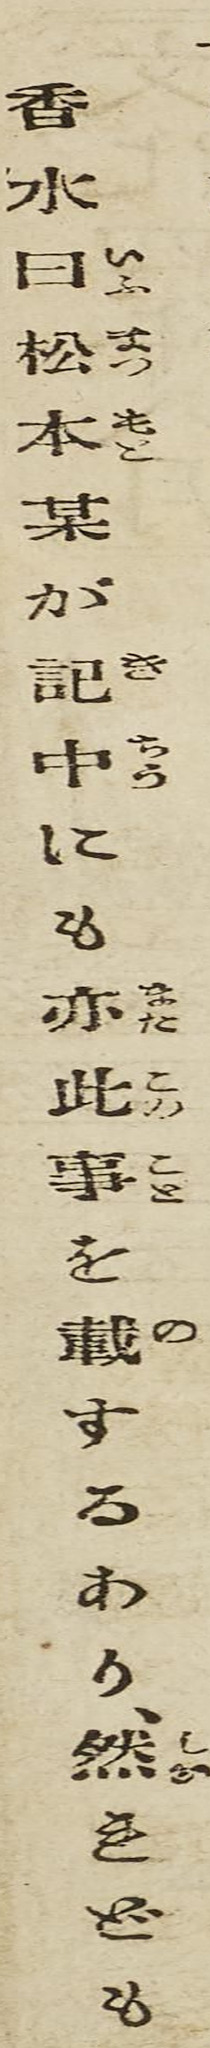香水曰松本某が記中にも亦此事を載するあり、然れども

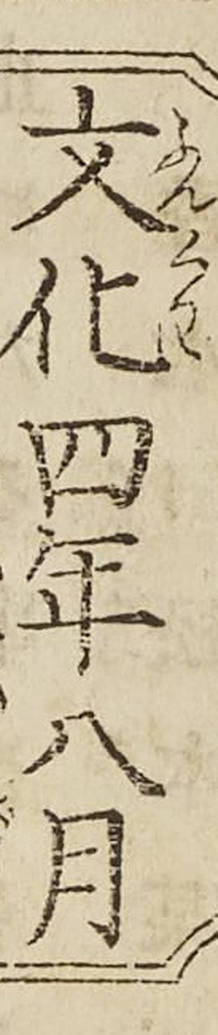文化四年八月
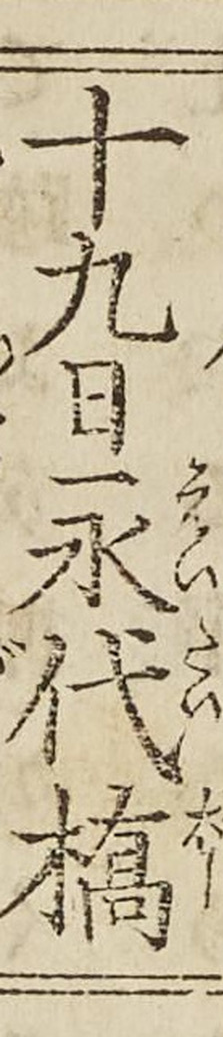十九日永代橋
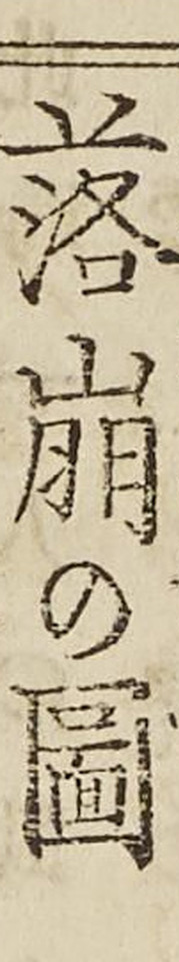落崩の図
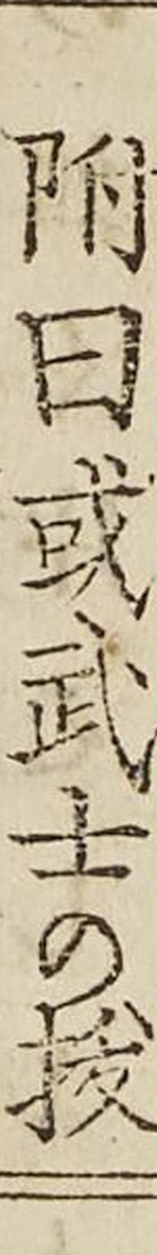付曰或武士の抜
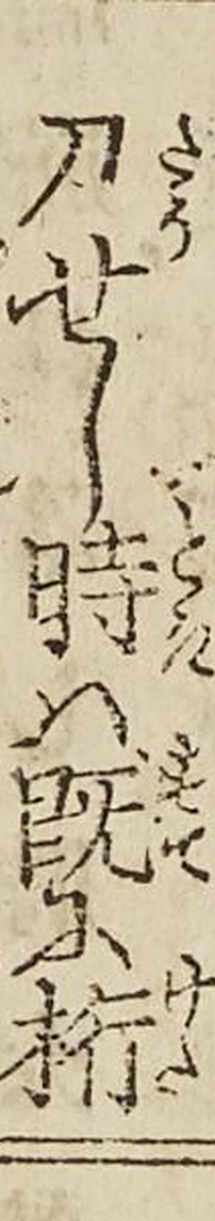刀せし時は既に桁
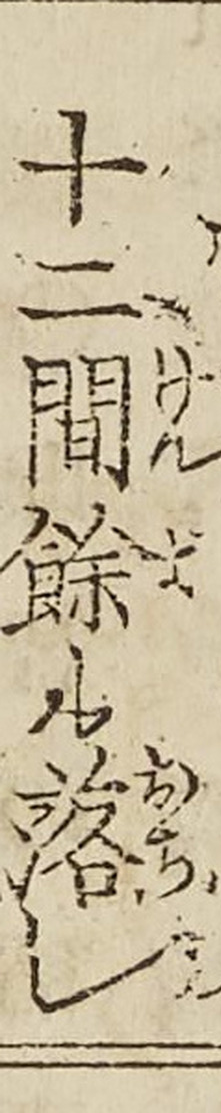十二間余も落し
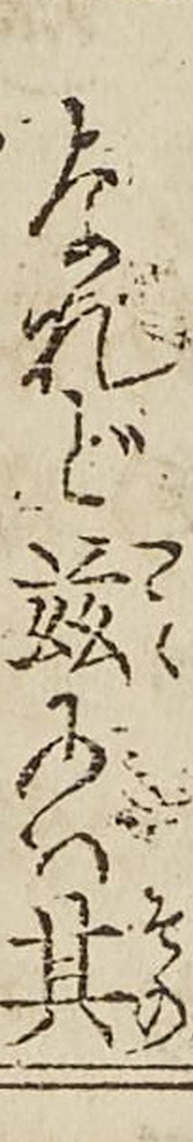なれど茲には其
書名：永代惨話　文化の夢　全
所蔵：東京大学地震研究所図書室 Earthquake Research Institute Library, The University of Tokyo, JAPAN
